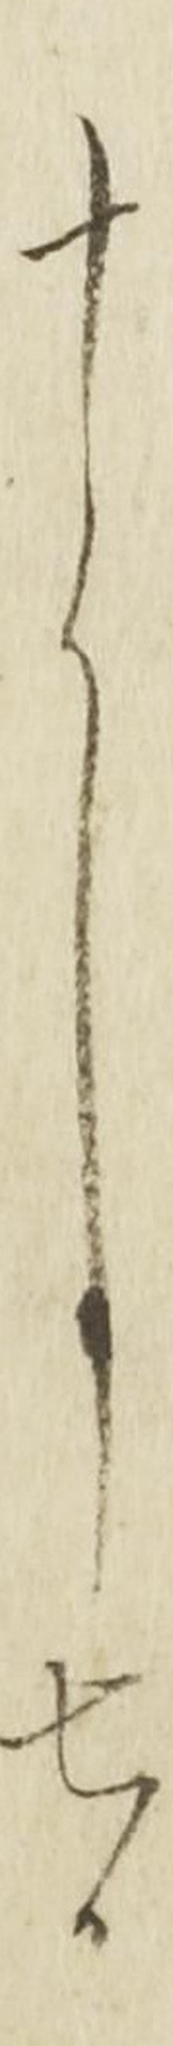十月七日
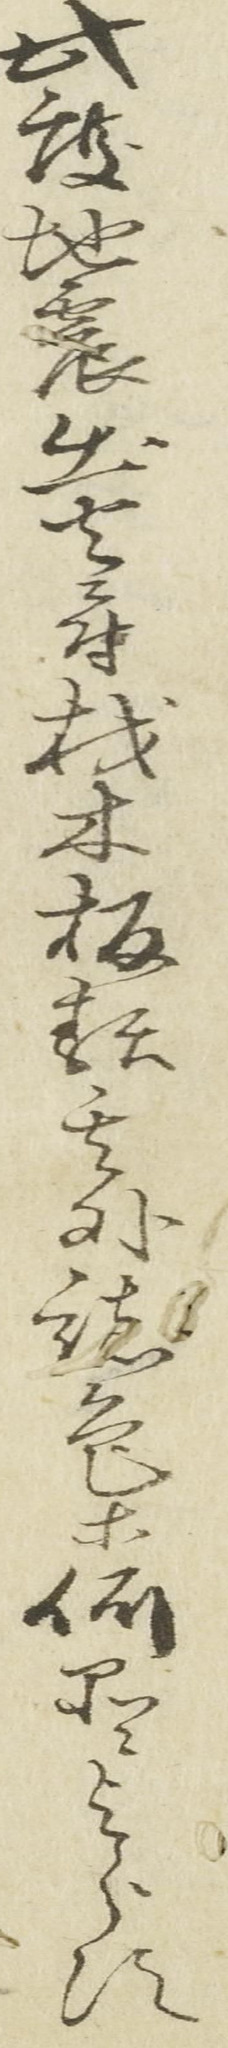此度地震出火ニ付材木板類其外諸色等例品ニよらす
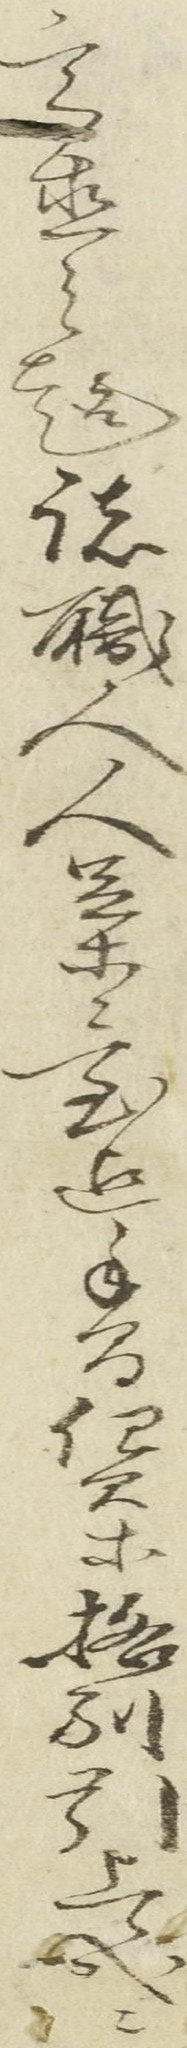高直之趣諸職人人足等二至迄手間賃等格別引上候哉ニ
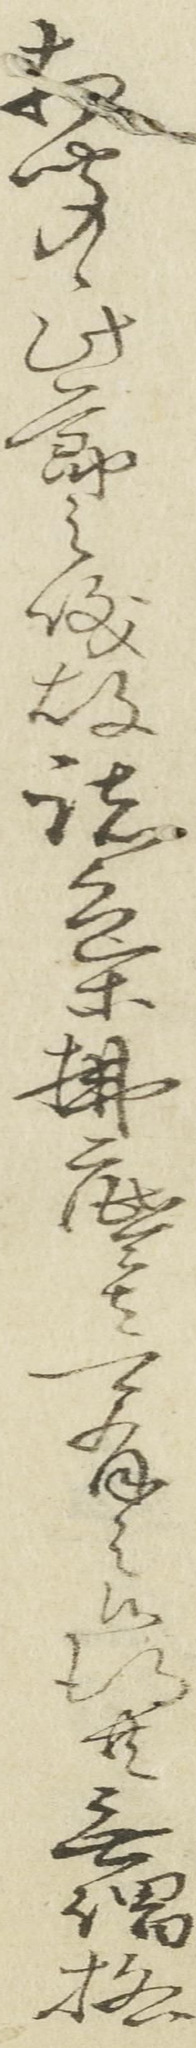相聞候此節之儀故諸色等払底二は可有之候得共無謂格
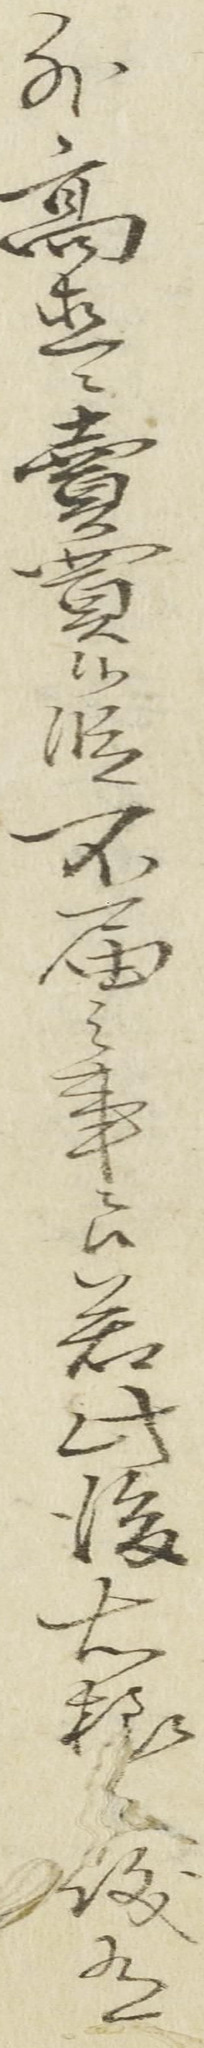外高直二売買候段不届之事ニ候若此後右様之儀有
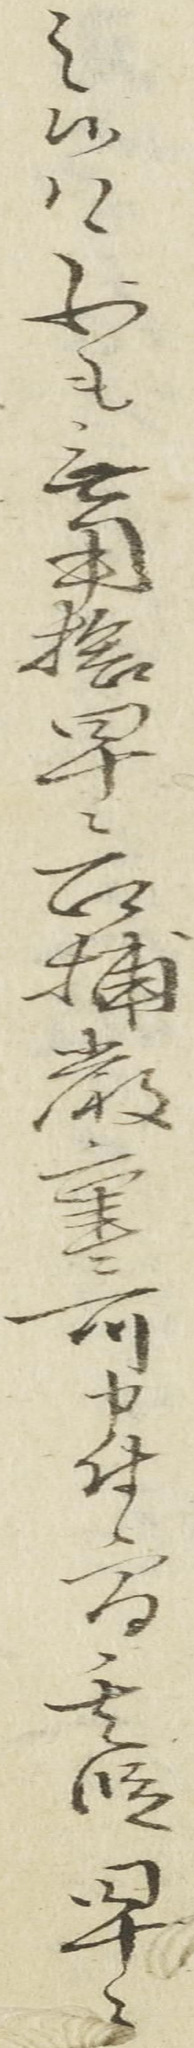之候ハゝ少も無用捨早々召捕厳重二可申付候間其段早々
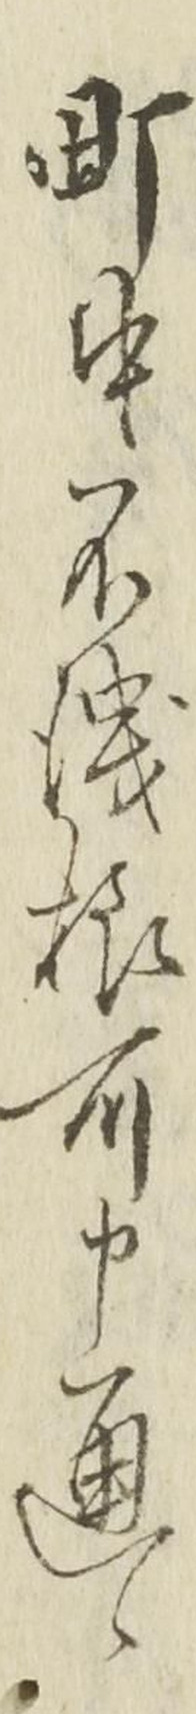町中不洩様可申通候
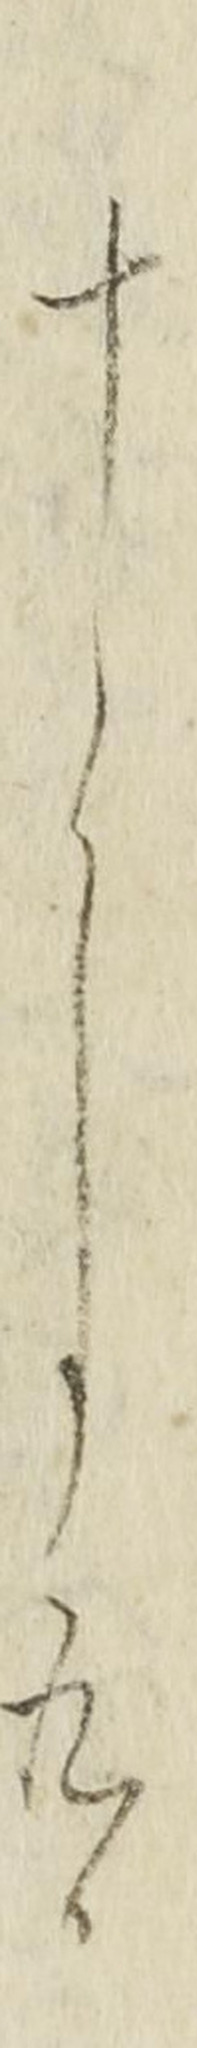十月九日
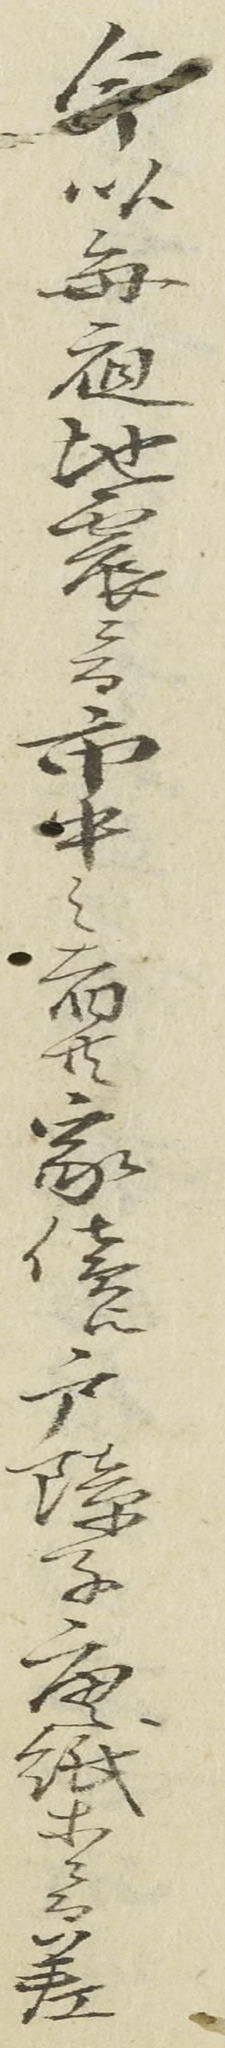今以毎夜地震二而市中之者共家債え戸障子唐紙等二而差
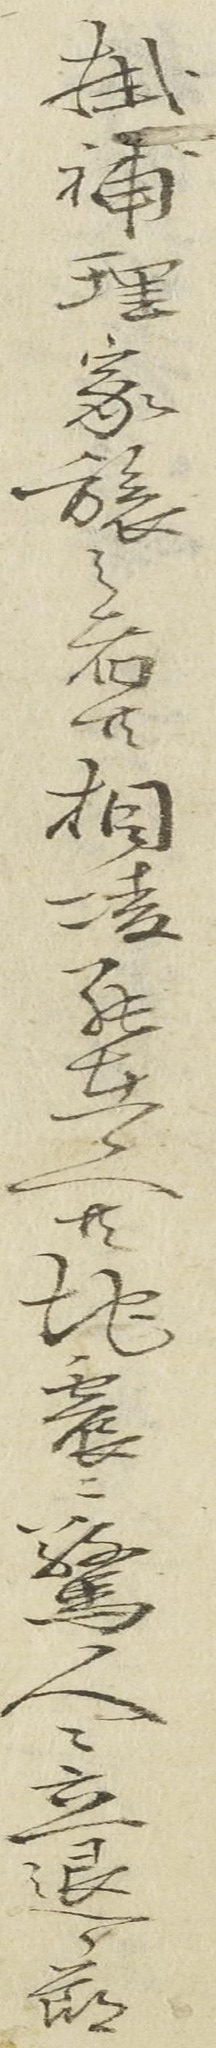掛補理家旅之者共相凌罷在候へ共地震二驚人々立退之節
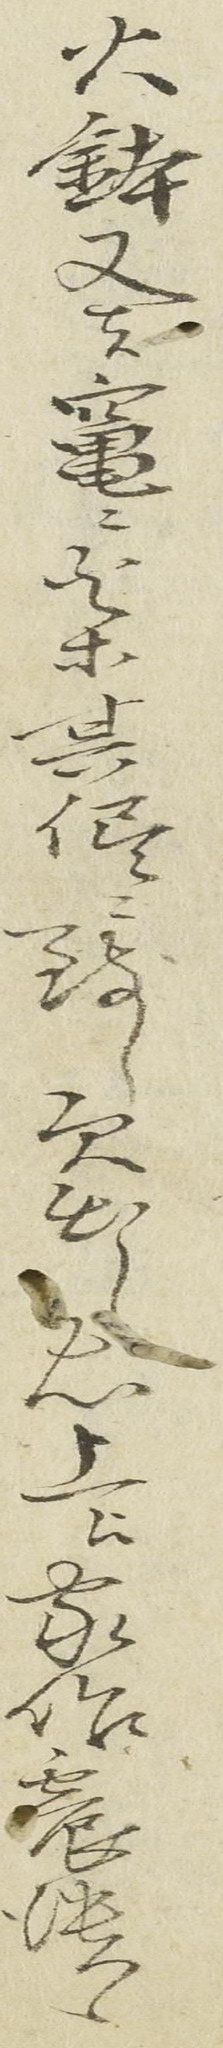火鉢又は竈二火等其侭二致し欠出し右上え家作震潰候
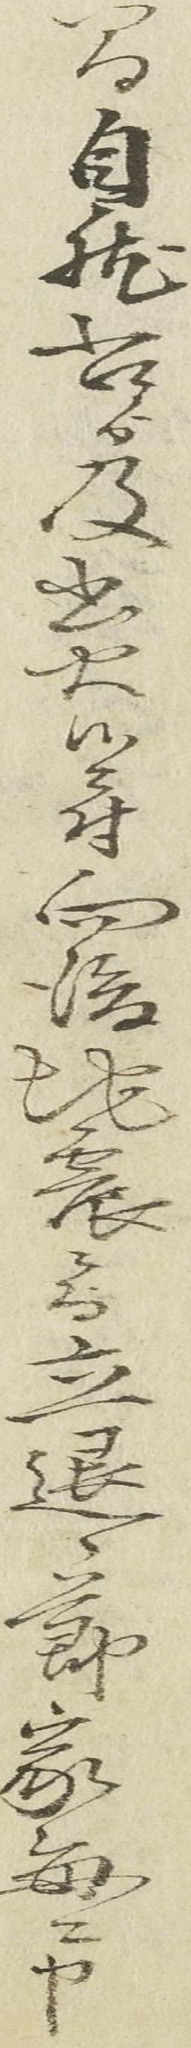間自然右ゟ及出火候二付向後地震二而立退候節家毎二申
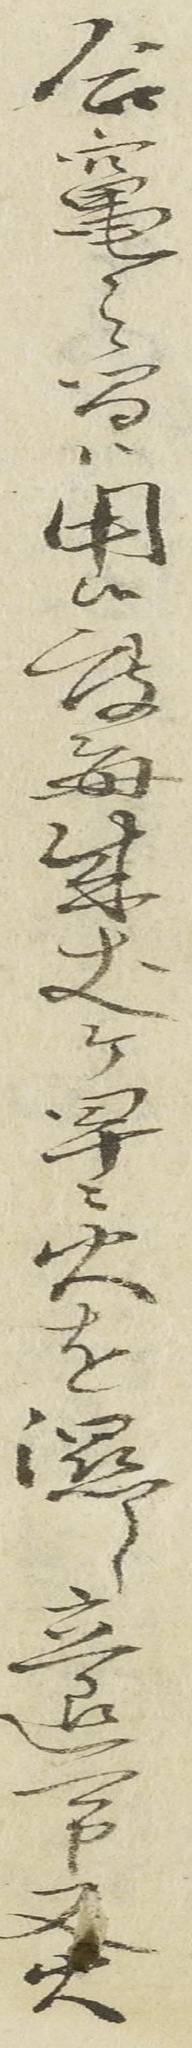合竈の間ハ用候度毎成丈ケ早々火を湿立退可申す又火
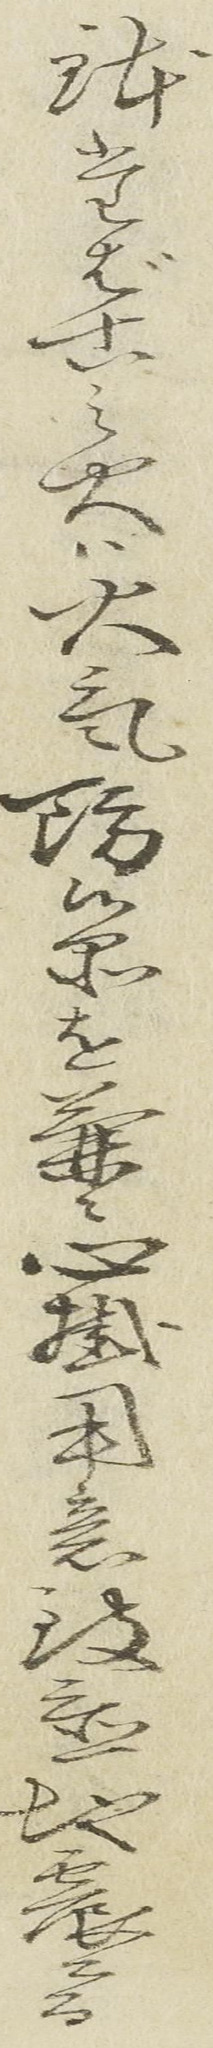鉢たばこの火ハ火気防候品を兼々心掛用意致置地震二而
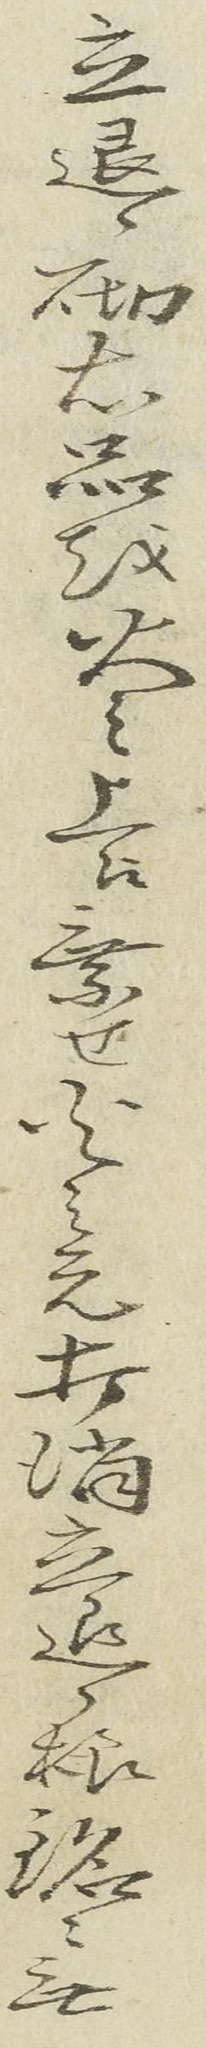立退候砌右品を火之上え乗せ火の元打消立退候様銘々無
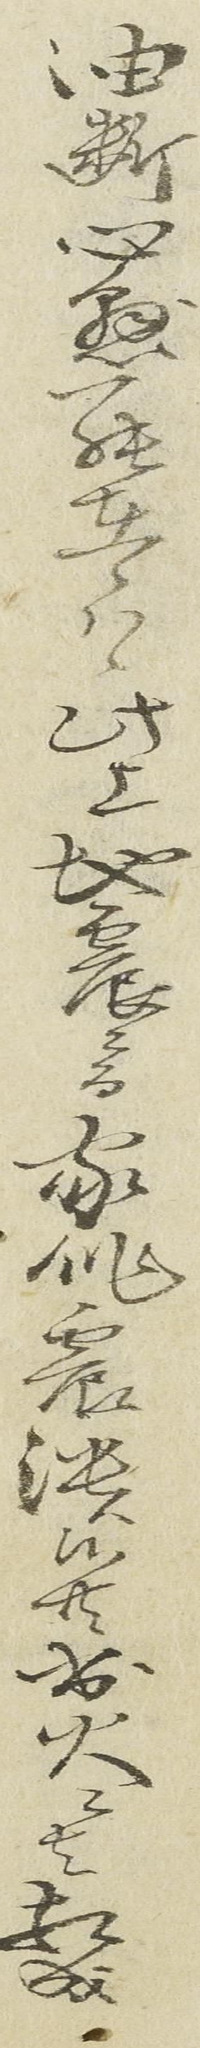油断必懸罷在候ハゝ此上地震二而家作震潰候共出火には相成
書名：安政二乙卯年十月二日大地震之事
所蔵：東京大学地震研究所図書室 Earthquake Research Institute Library, The University of Tokyo, JAPAN
